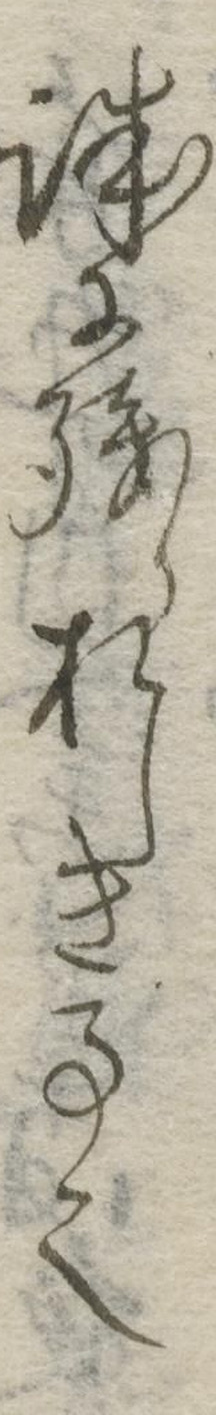殊に残りおしき事也
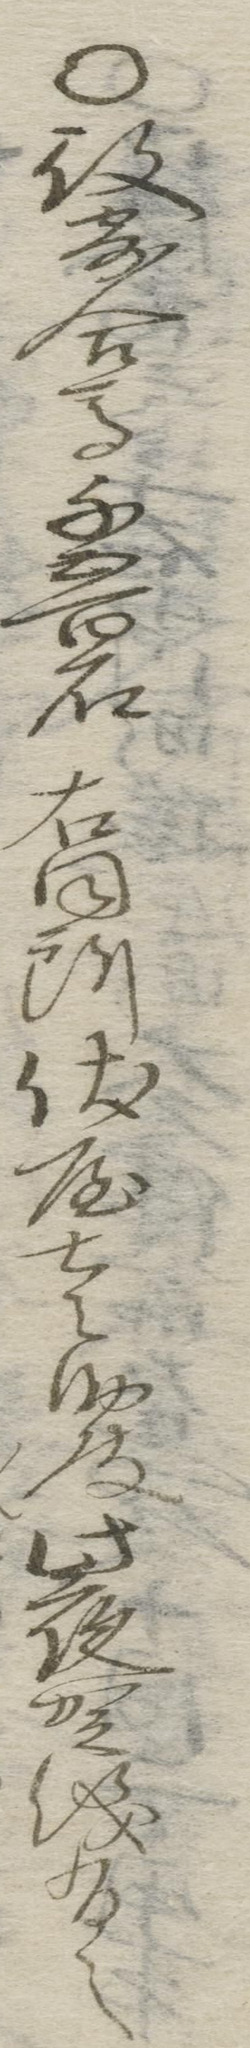○役寄合高千五百石右同所伏屋七之助殿此夜賀儀有之
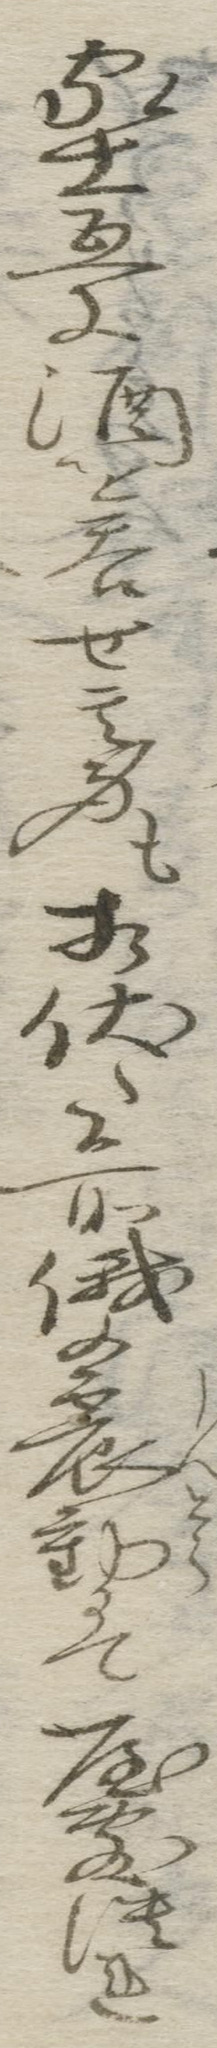家士互に酒を呑せ其身も相伏たる所俄の震動にて屋敷潰れ
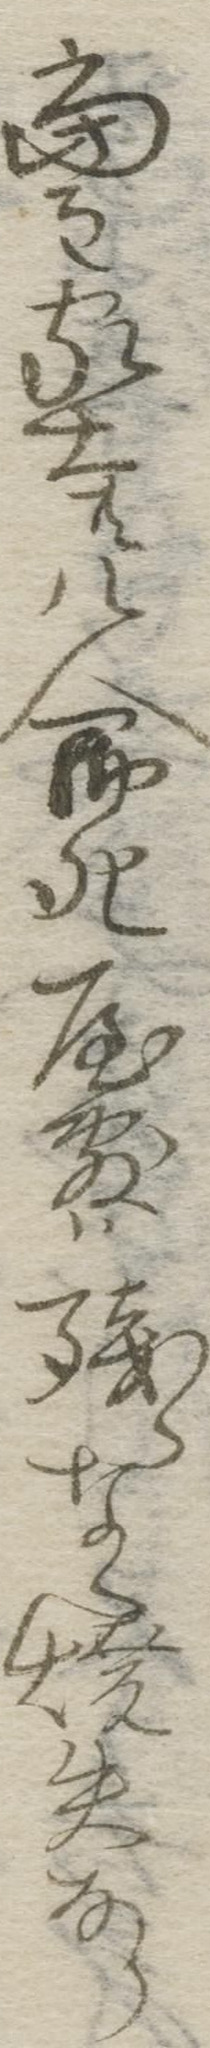当主家士共八人即死屋敷ハ残りなく焼失なり
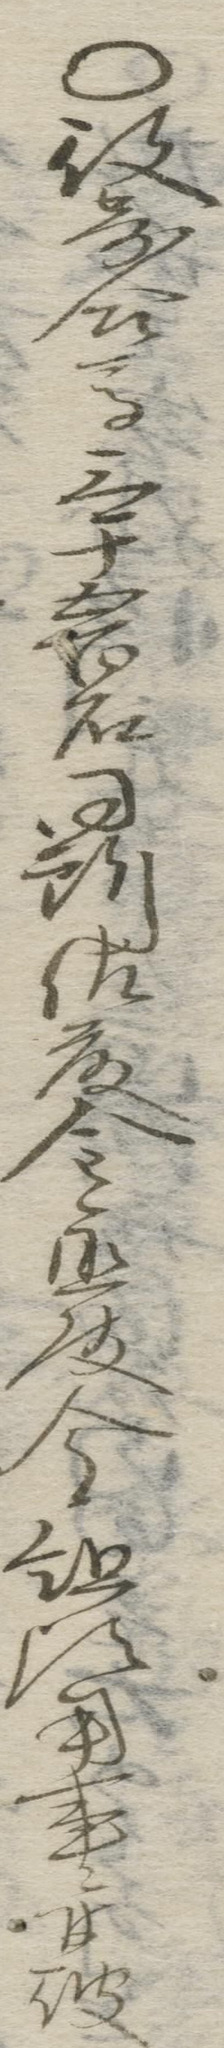○役寄合高三千五百石同所佐藤金之丞殿同組頭用事ニ付彼
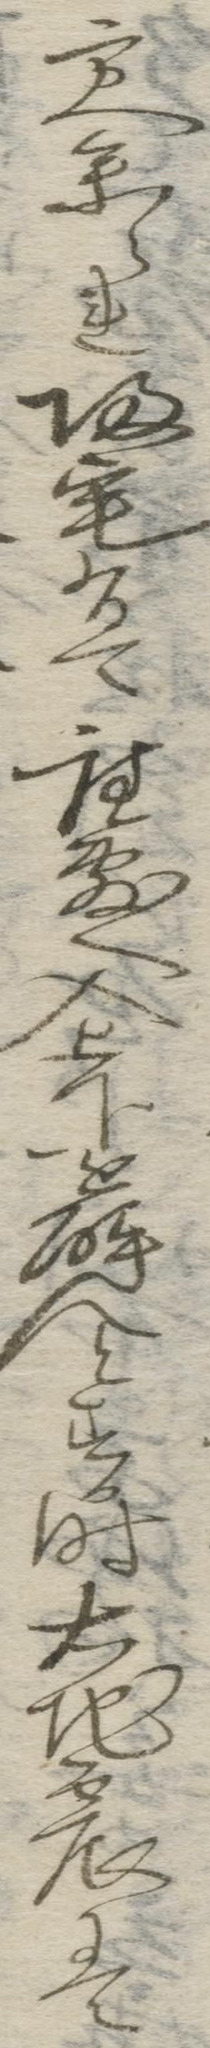方へ参られ帰宅有て座敷へ入上下を解んとする時右地震にて
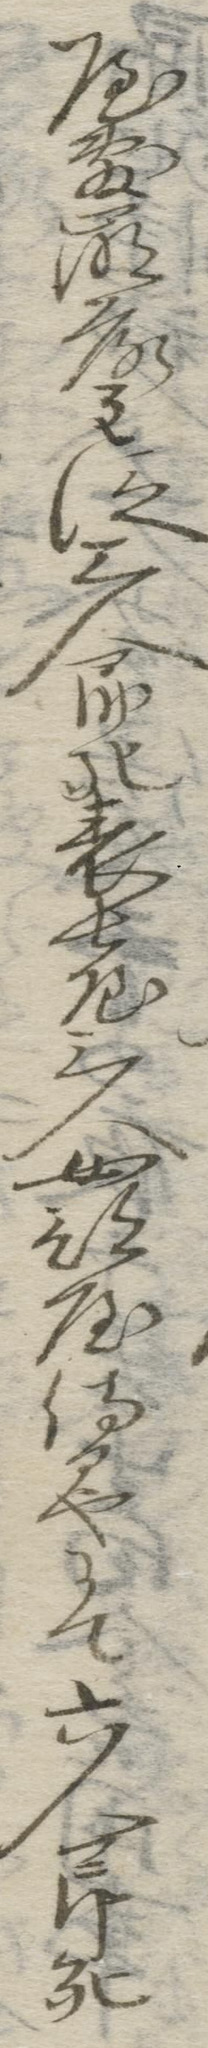屋敷崩落主従三人即死表長屋三人女部屋待部やにて六人即死
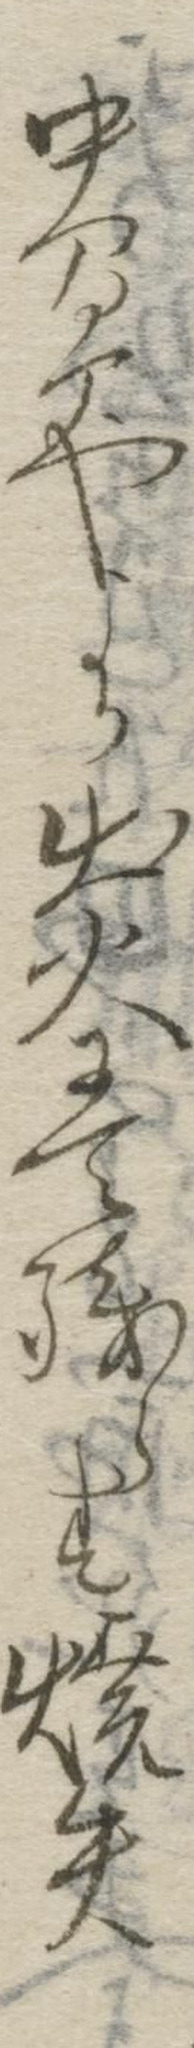中間へやより出火にて残らす焼失
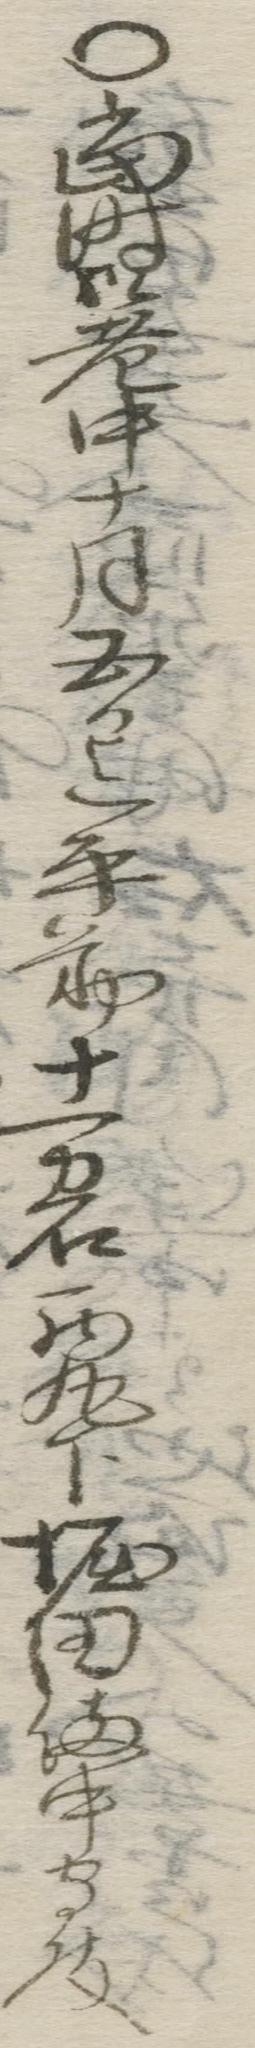○当時御老中十月五日迄平勤十万石西丸下堀田備中守殿
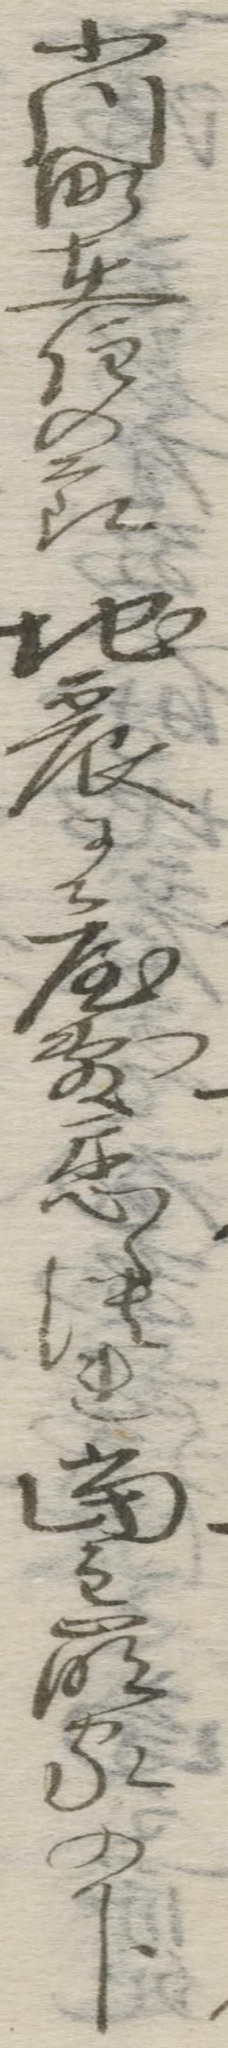小川町在住の節地震にて屋敷悉く潰れ当主崩家の下
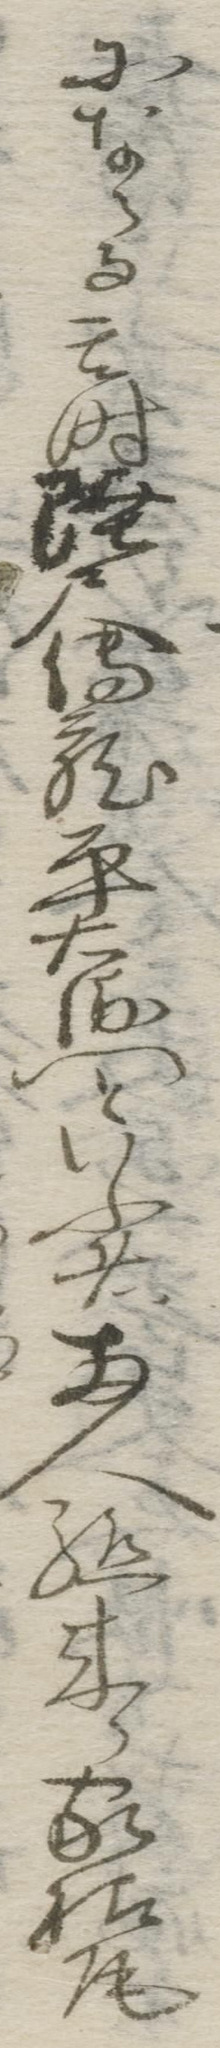にならる其時陸尺傳藏平右衛門といふ者両人駆来り家根瓦
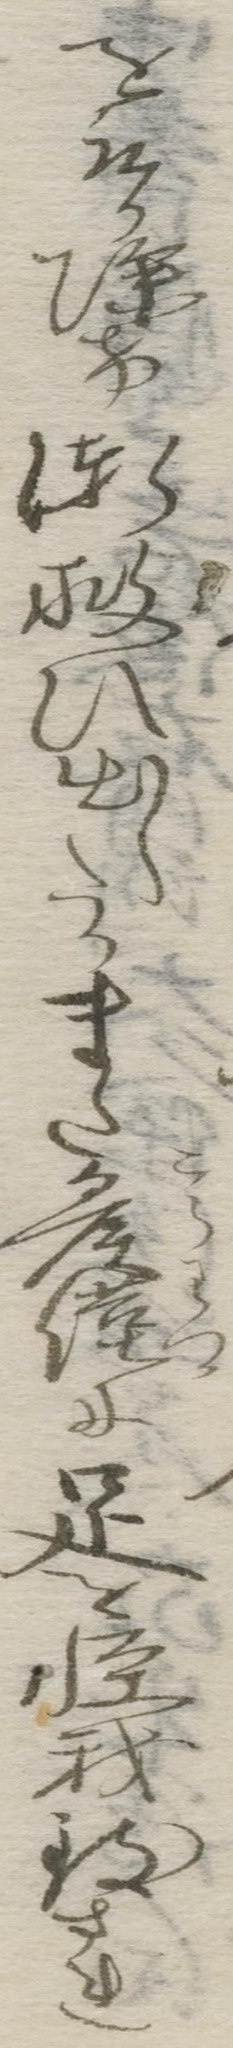を取り除け漸救ひ出したりまた侯僅に足を怪我致され
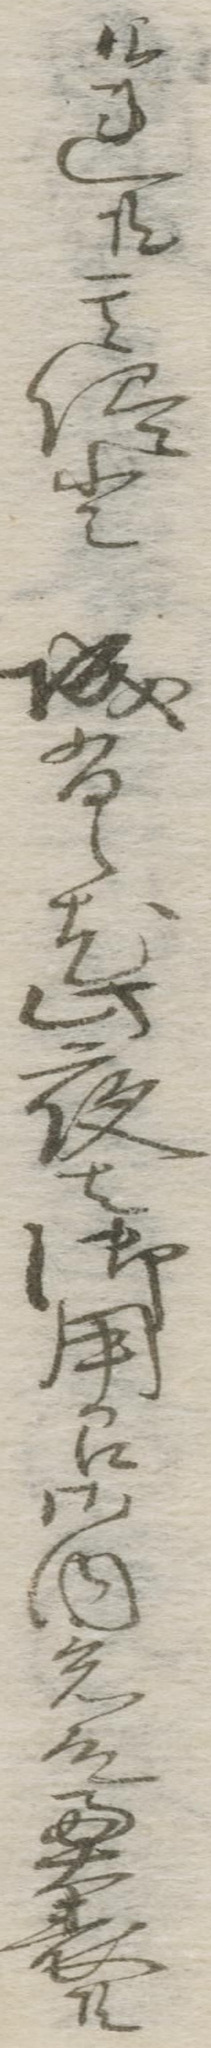けれ共其侭登城有之尤此夜者御用召御内見故奥表共
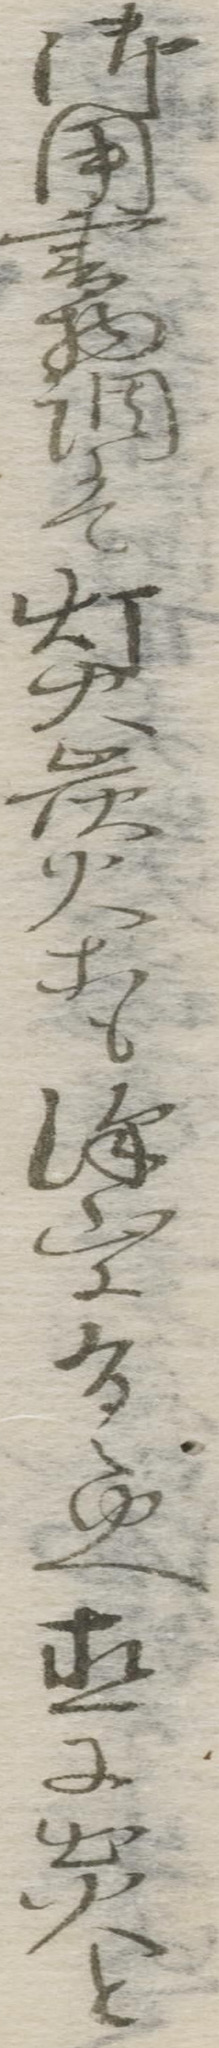御用書物調にて灯火炭火等も澤山に有之ゆへ直に出火と
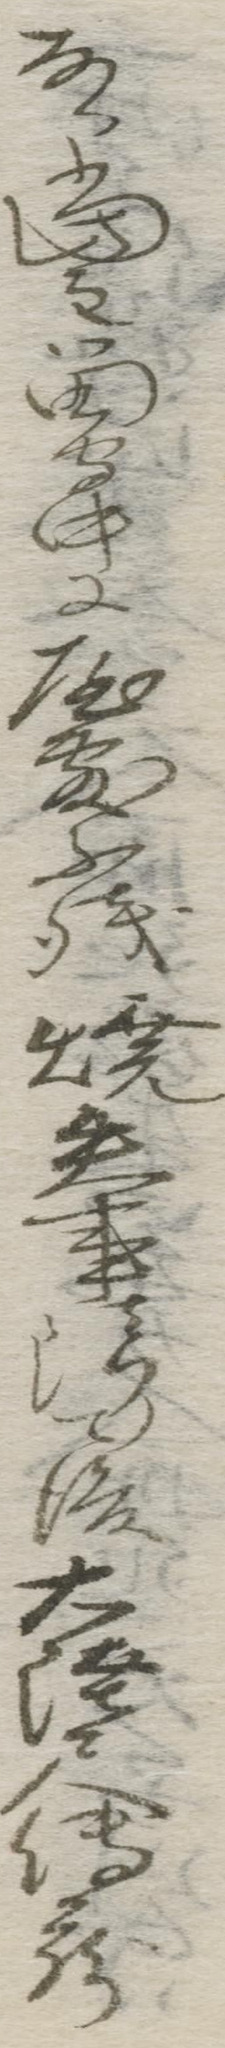なり当主留守中に屋敷不残焼失事凌て後右陸尺傳藏
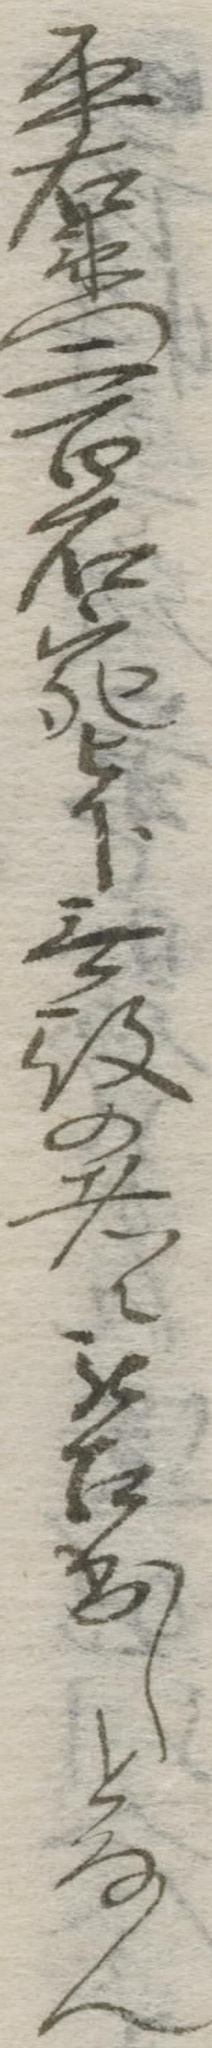平右衛門二百石宛被下無役の者ニ被召出しとなん
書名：江戸中諸屋敷　地震竒談録
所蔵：東京大学地震研究所図書室 Earthquake Research Institute Library, The University of Tokyo, JAPAN
